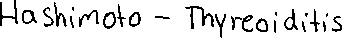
Hashimoto-Thyreoiditis
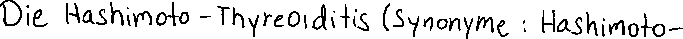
Die Hashimoto-Thyreoiditis (Synonyme: Hashimoto-
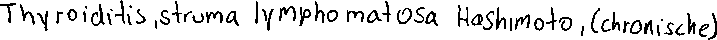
Thyroiditis, Struma lymphomatosa Hashimoto, (chronische)
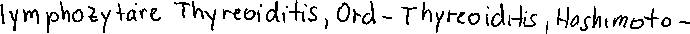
lymphozytäre Thyreoiditis, Ord-Thyreoiditis, Hashimoto-
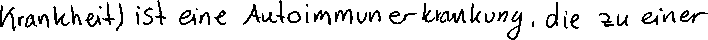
Krankheit) ist eine Autoimmunerkrankung, die zu einer
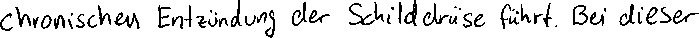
chronischen Entzündung der Schilddrüse führt. Bei dieser
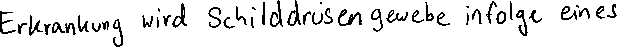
Erkrankung wird Schilddrüsengewebe infolge eines
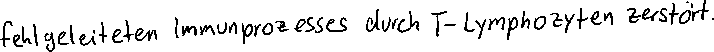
fehlgeleiteten Immunprozesses durch T-Lymphozyten zerstört.
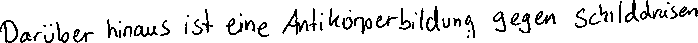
Darüber hinaus ist eine Antikörperbildung gegen schilddrüsen
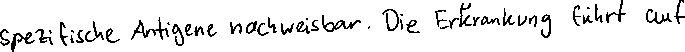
spezifische Antigene nachweisbar. Die Erkrankung führt auf
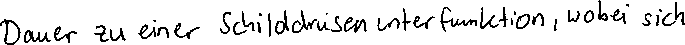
Dauer zu einer Schilddrüsenunterfunktion, wobei sich
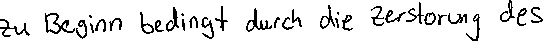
zu Beginn bedingt durch die Zerstörung des
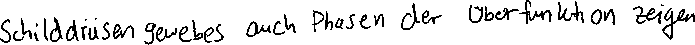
Schilddrüsengewebes auch Phasen der Überfunktion zeigen
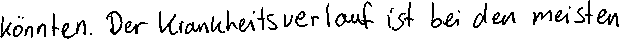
könnten. Der Krankheitsverlauf ist bei den meisten
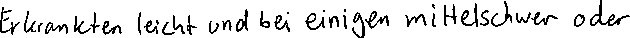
Erkrankten leicht und bei einigen mittelschwer oder
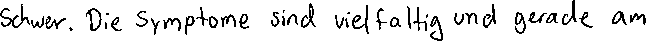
schwer. Die Symptome sind vielfältig und gerade am
